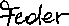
Feder
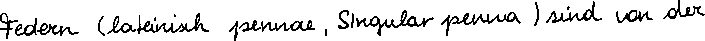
Federn (lateinisch pennae, Singular penna) sind von der
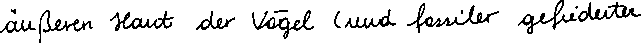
äußeren Haut der Vögel (und fossiler gefiederter
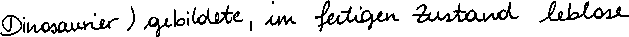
Dinosaurier) gebildete, im fertigen Zustand leblose
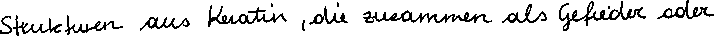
Strukturen aus Keratin, die zusammen als Gefieder oder
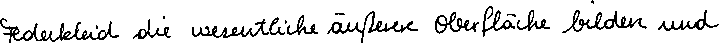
Federkleid die wesentliche äußere Oberfläche bilden und
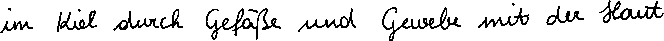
im Kiel durch Gefäße und Gewebe mit der Haut
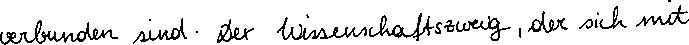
verbunden sind. Der Wissenschaftszweig, der sich mit
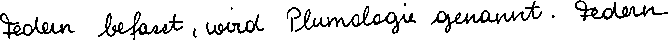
Federn befasst, wird Plumologie genannt.Federn
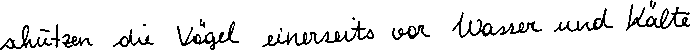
schützen die Vögel einerseits vor Wasser und Kälte
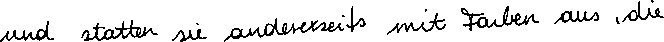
und statten sie andererseits mit Farben aus, die
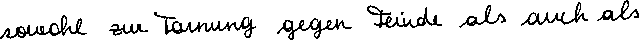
sowohl zur Tarnung gegen Feinde als auch als
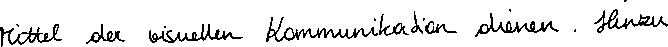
Mittel der visuellen Kommunikation dienen. Hinzu
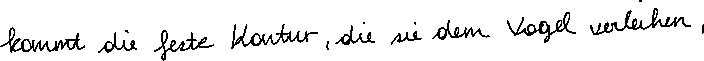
kommt die feste Kontur, die sie dem Vogel verleihen,
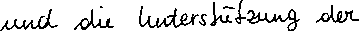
und die Unterstützung der
